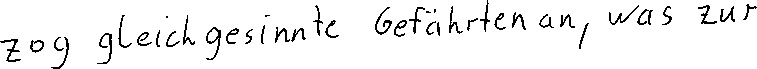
zog gleichgesinnte Gefährten an, was zur
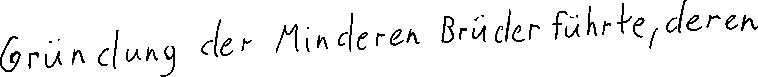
Gründung der Minderen Brüder führte, deren
